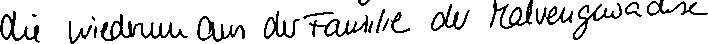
die wiederum aus der Familie der Malvengewächse
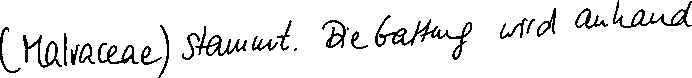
(Malvaceae) stammt. Die Gattung wird anhand
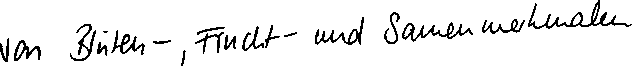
von Blüten-, Frucht- und Samenmerkmalen
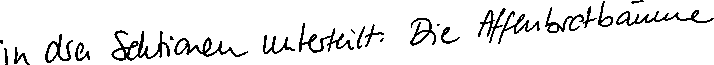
in drei Sektionen unterteilt. Die Affenbrotbäume
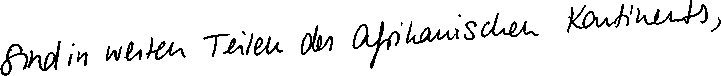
sind in weiten Teilen des afrikanischen Kontinents,
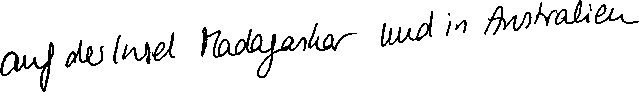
auf der Insel Madagaskar und in Australien
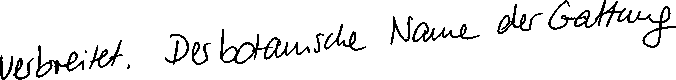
verbreitet. Der botanische Name der Gattung
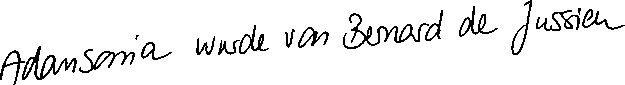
Adansonia wurde von Bernard de Jussieu
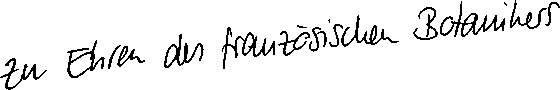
zu Ehren des französischen Botanikers
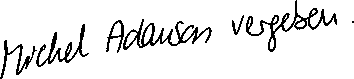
Michel Adanson vergeben.
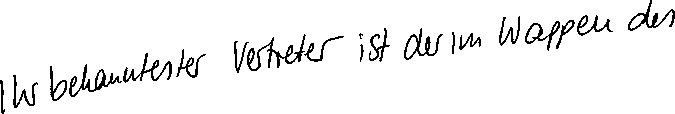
Ihr bekanntester Vertreter ist der im Wappen des
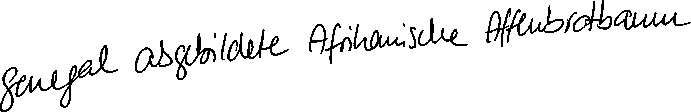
Senegal abgebildete Afrikanische Affenbrotbaum
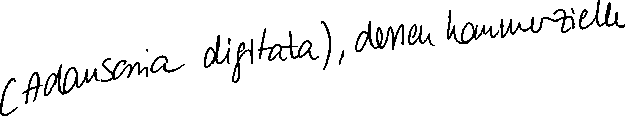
(Adansonia digitata), dessen kommerzielle
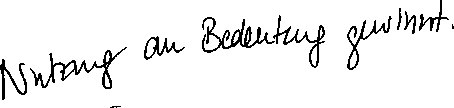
Nutzung an Bedeutung gewinnt.
